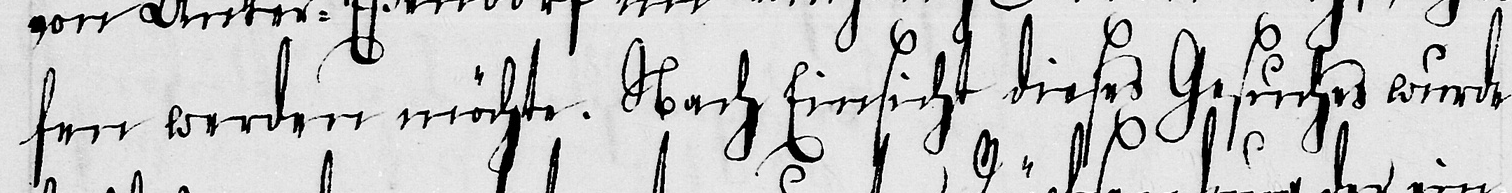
fen werden möchte. Nach Einsicht dieses Gesuches wurde
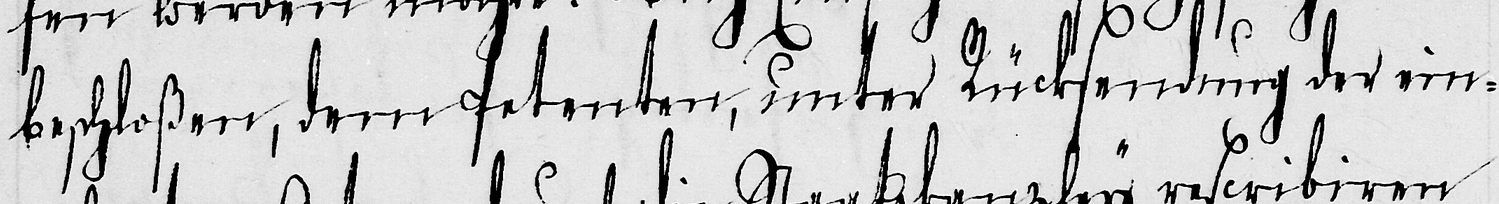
beschloßen, dem Petenten, unter Rücksendung der ein¬
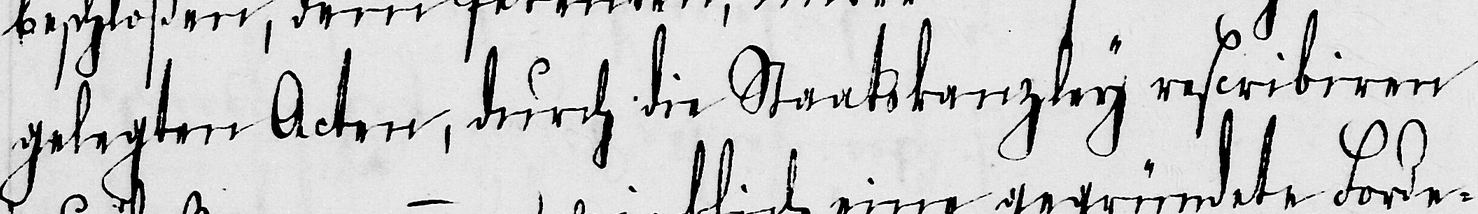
gelegten Acten, durch die Staatskanzley rescribiren
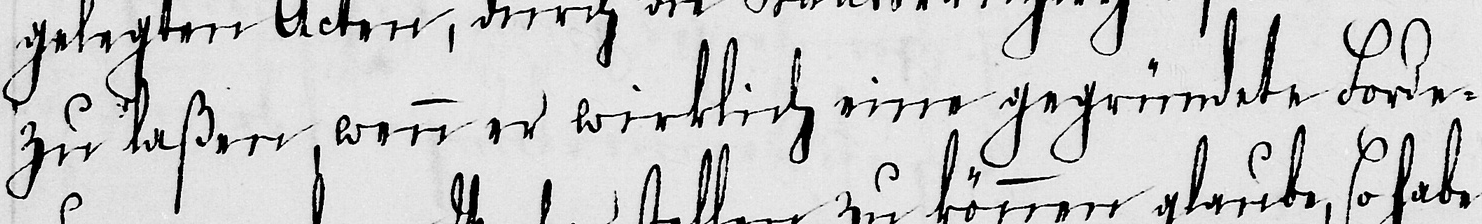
zu laßen, wenn er wirklich eine gegründete Forde¬
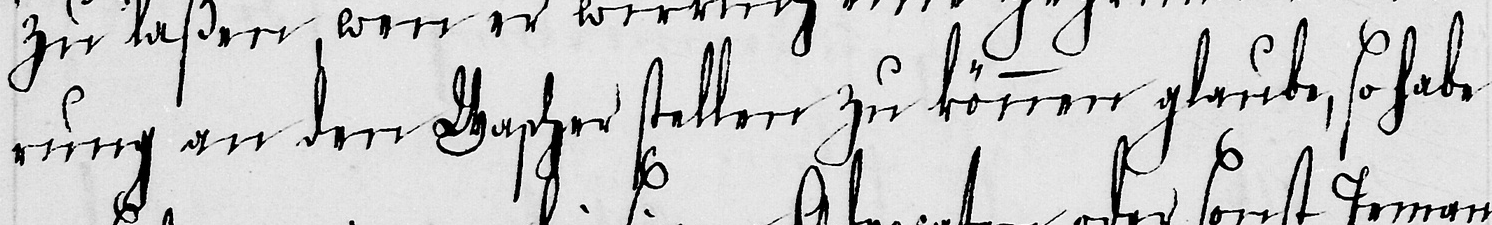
rung an den Wascher stellen zu können glaube, so habe
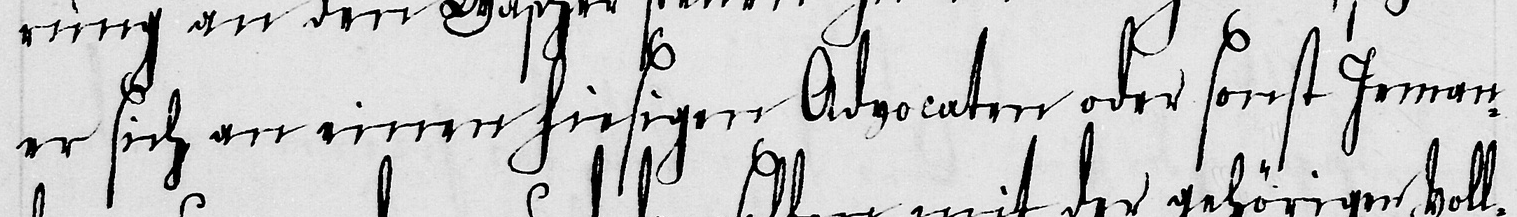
er sich an einen hiesigen Advocaten oder sonst Jeman¬
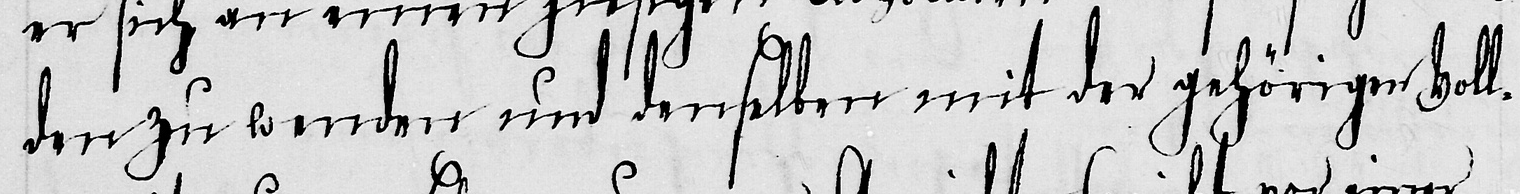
den zu wenden und denselben mit der gehörigen Vol¬
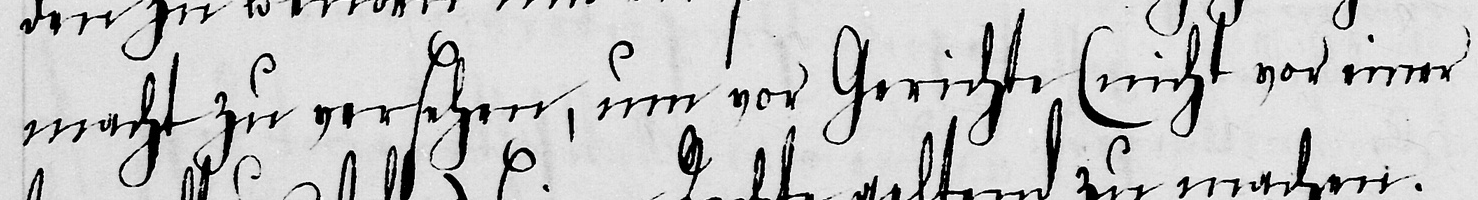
lmacht zu versehen, um vor Gerichte (nicht vor einer
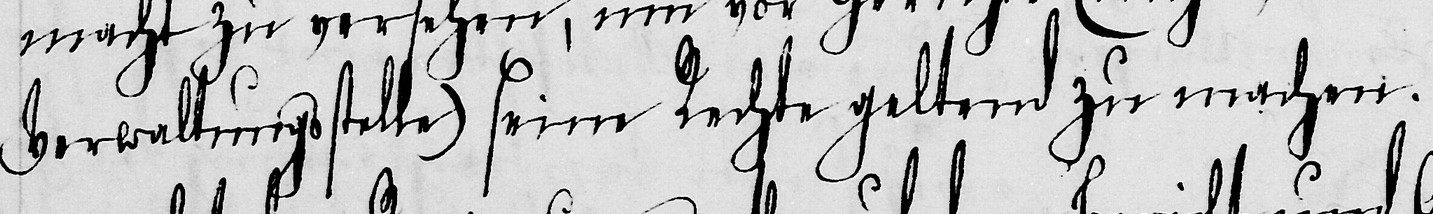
Verwaltungsstelle) seine Rechte geltend zu machen.
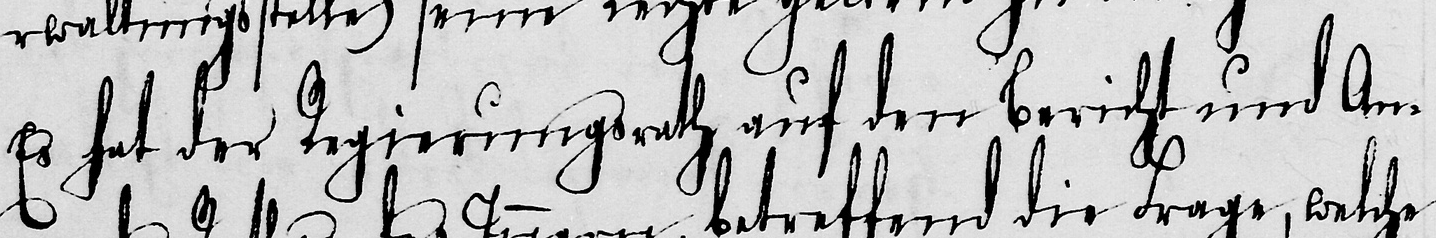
Es hat der Regierungsrath auf den Bericht und An¬
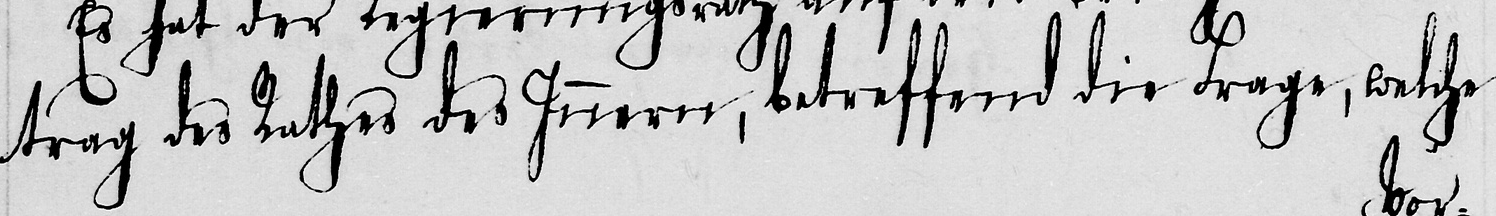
trag des Rathes des Innern, betreffend die Frage, welche
